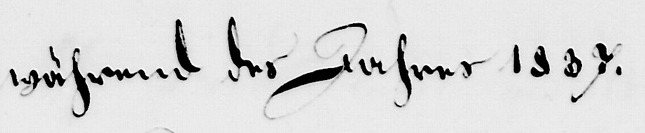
während des Jahres 1837.
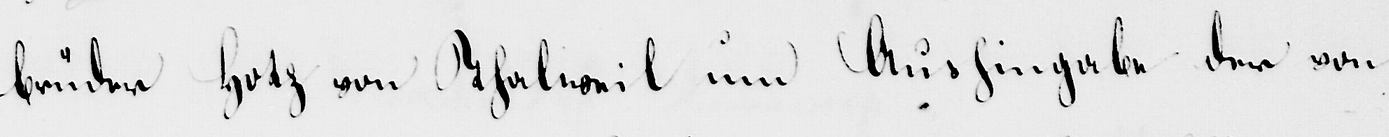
brüder Hotz von Thalweil um Aushingabe der von
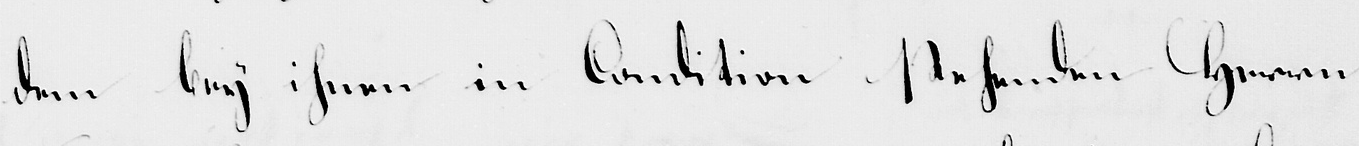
dem bey ihnen in Condition stehenden Herrn
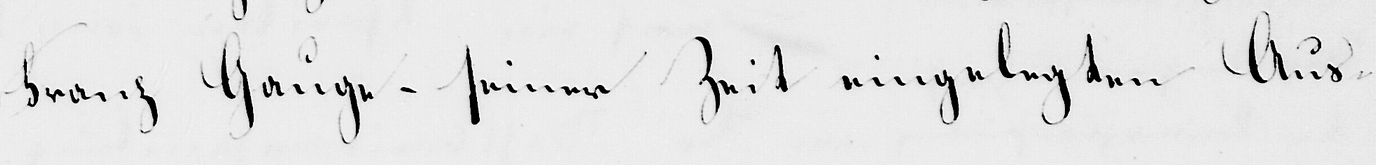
Franz Gauge – seiner Zeit eingelegten Aus¬
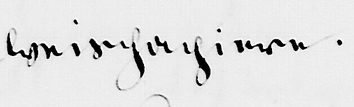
weispapiere.
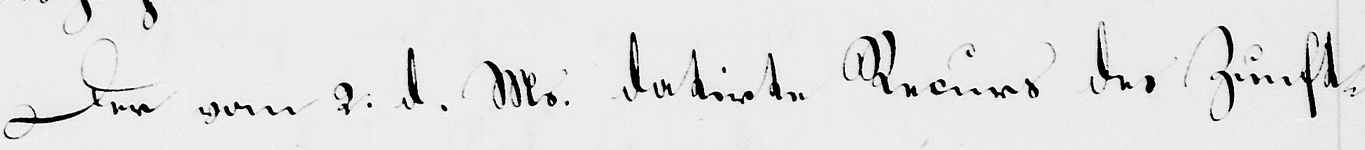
Der vom 2. d. Ms. datirte Recurs des Zunft¬
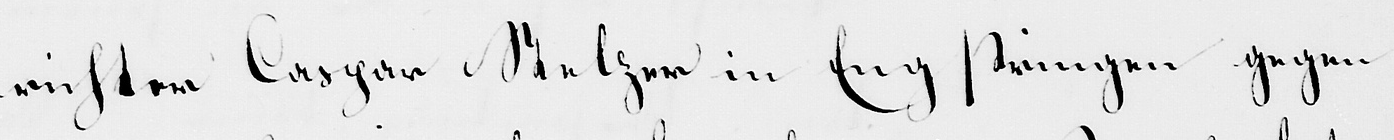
richter Caspar Stelzer in Engstringen gegen
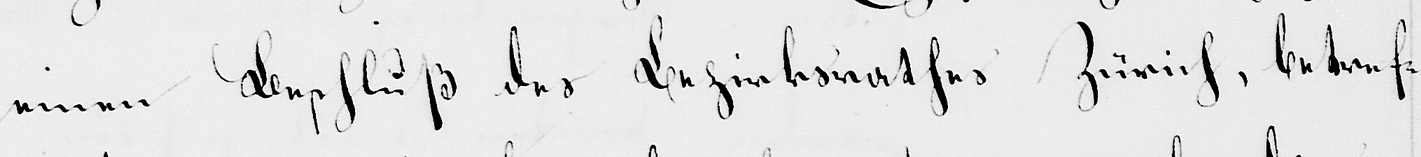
einen Beschluß des Bezirksrathes Zürich, betref¬
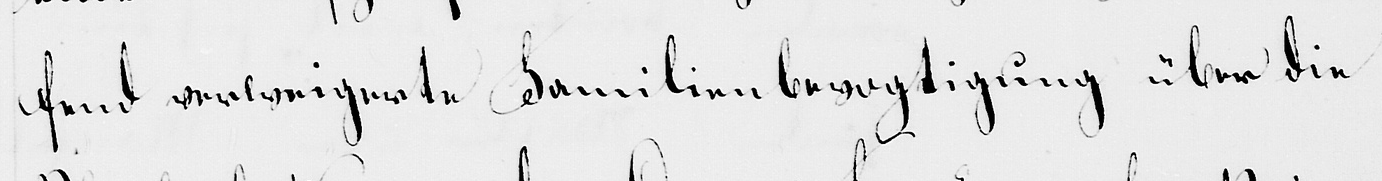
fend verweigerte Familienbevogtigung über die
